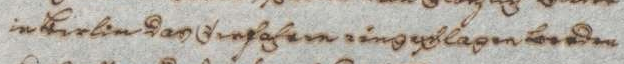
in Berlin das Verfahren eingeschlagen werden
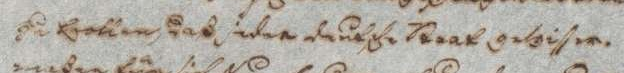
zu wollen, daß jeder deutsche Staat gewisser-
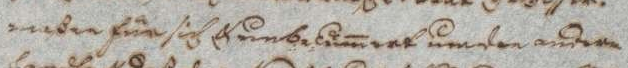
maßen für sich & unbekümmert um den andern
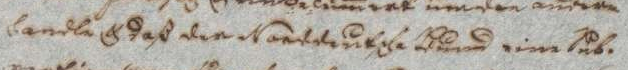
handle & daß der Norddeutsche Bund eine Sub-
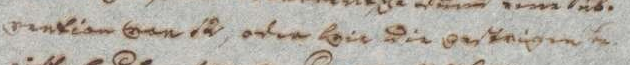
vention von 12, oder wie die gestrigen Be-
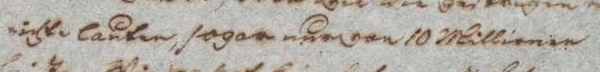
richte lauten, sogar nur von 10 Millionen
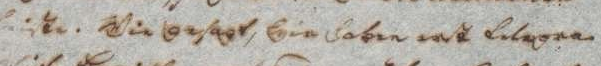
leiste. Wie gesagt, wir haben erst telegra-
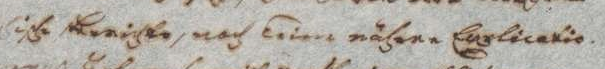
phische Berichte, noch keine nähern Explicatio-
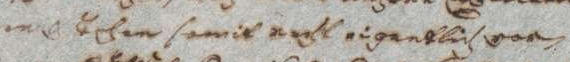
nen & stehen somit recht eigentlich vor
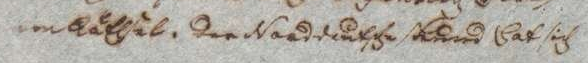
einem Räthsel. Der Norddeutsche Bund hat sich
